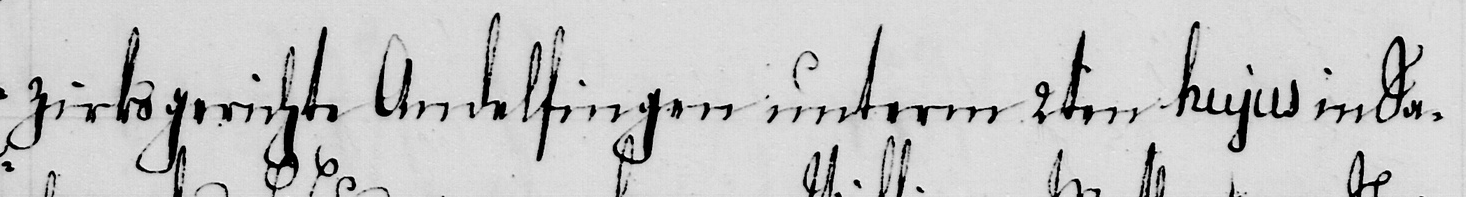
zirksgerichte Andelfingen unterm 2ten hujus in Sa¬
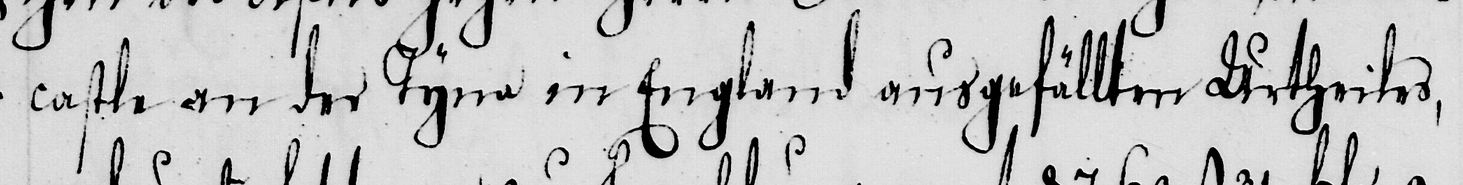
wcastle an der Tyna in England ausgefällten Urtheiles,
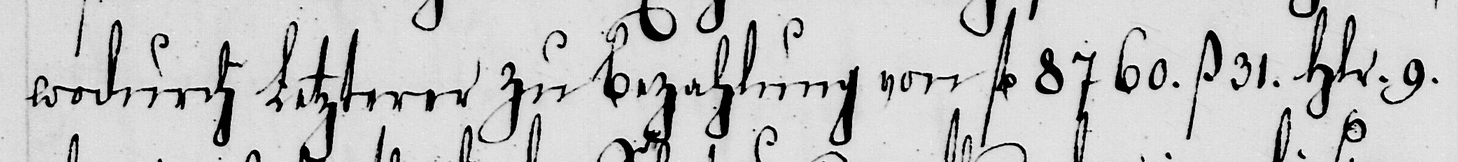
wodurch Letzterer zu Bezahlung von fl. 8760. ß 31. Hlr. 9.
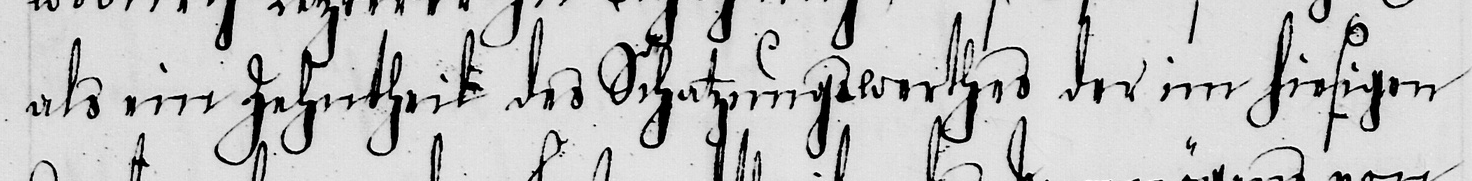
als ein Zehntheil des Schatzungswerthes der im hiesigen
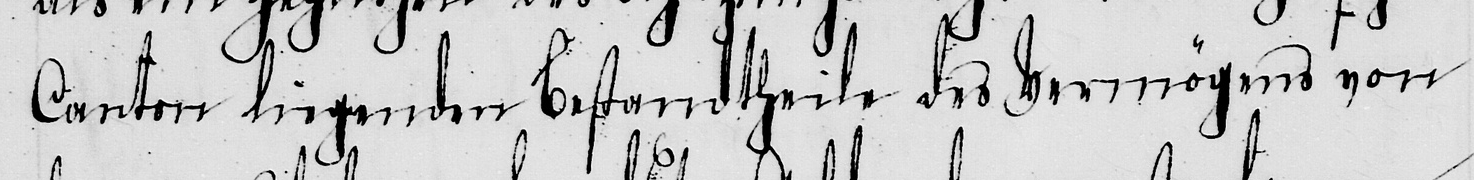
Canton liegenden Bestandtheile des Vermögens von
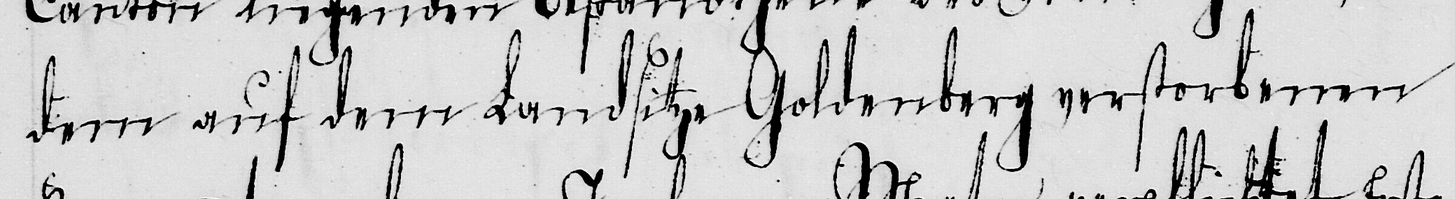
dem auf dem Landsitze Goldenberg verstorbenen
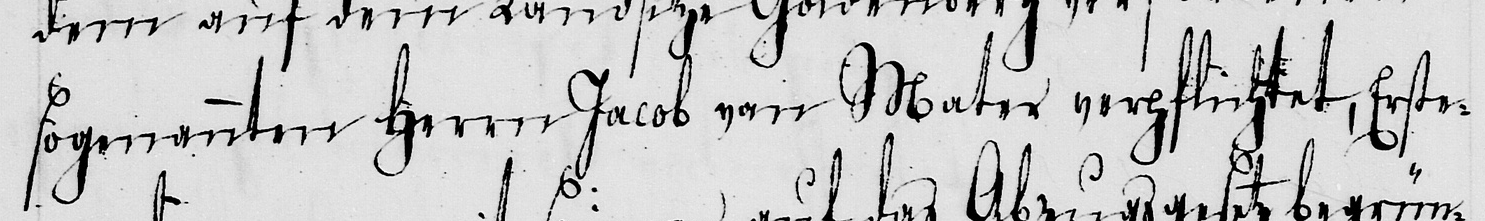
sogenannten Herrn Jacob van Mater verpflichtet, Erste¬
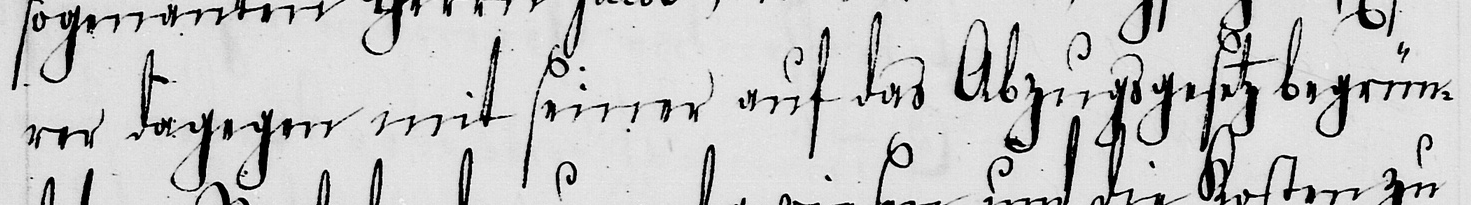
rer dagegen mit seiner auf das Abzugsgesetz begrün¬
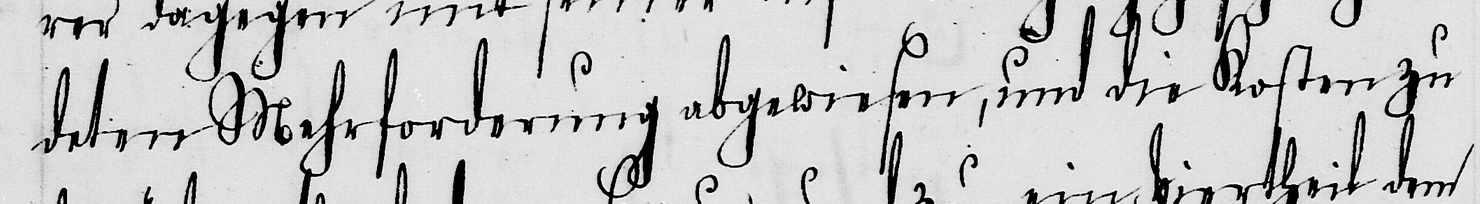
deten Mehrforderung abgewiesen, und die Kosten zu
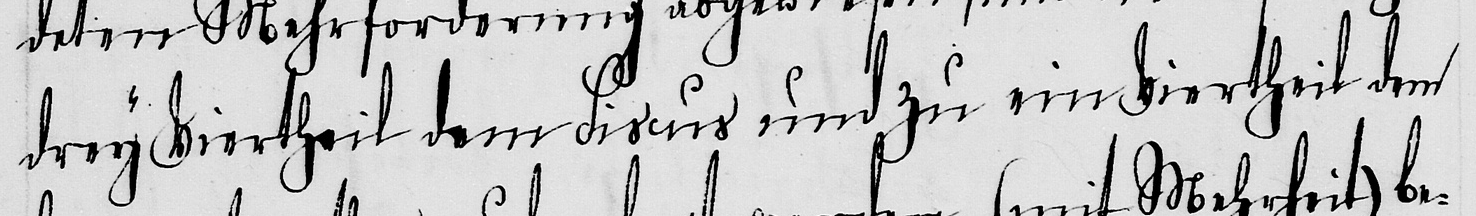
drey Viertheil dem Fiscus und zu ein Viertheil dem
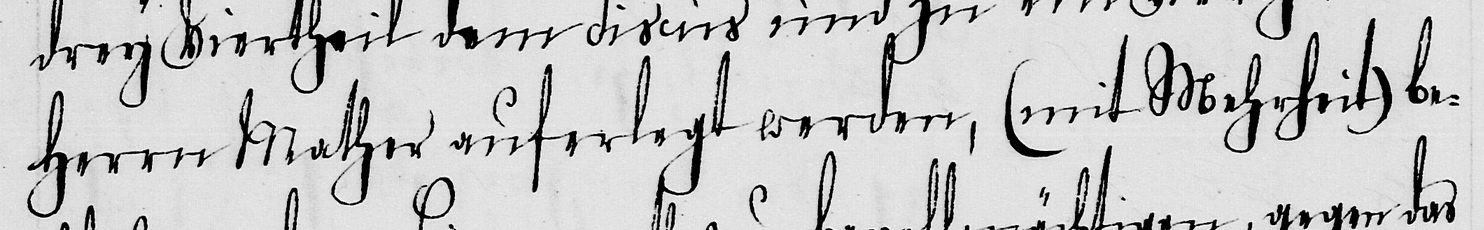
Herrn Mather auferlegt werden, (mit Mehrheit) be¬
